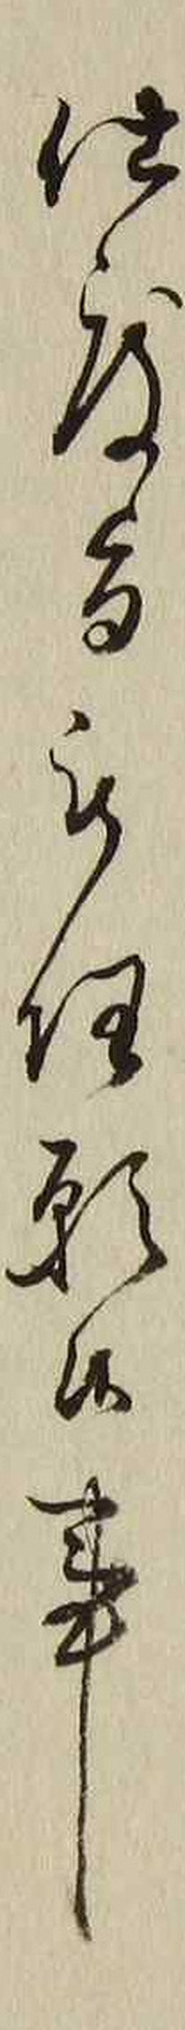仕度旨被任願候事
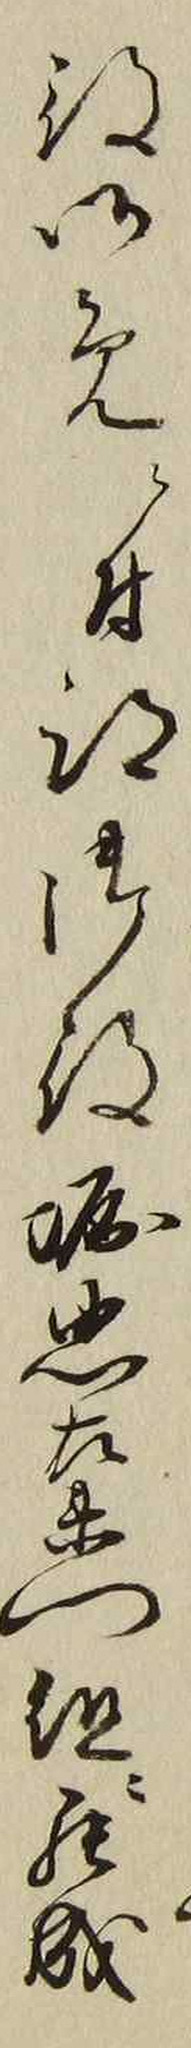役御免に付跡御役堀忠左衛門組に罷成

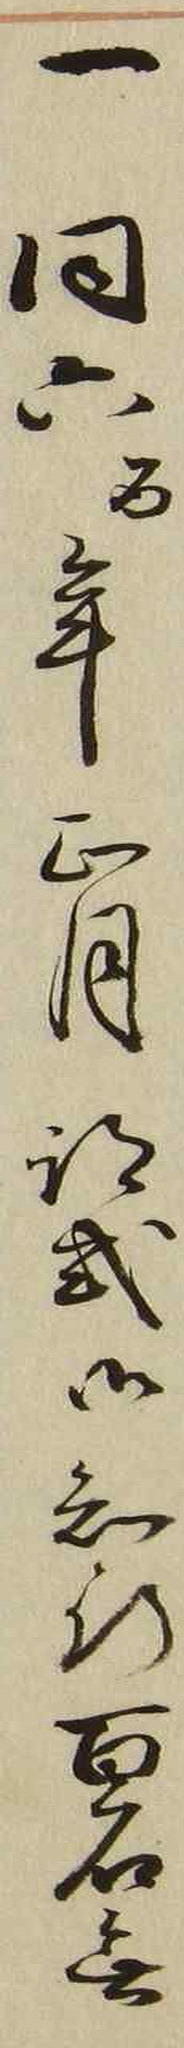一同六酉年正月跡式御知行百石無
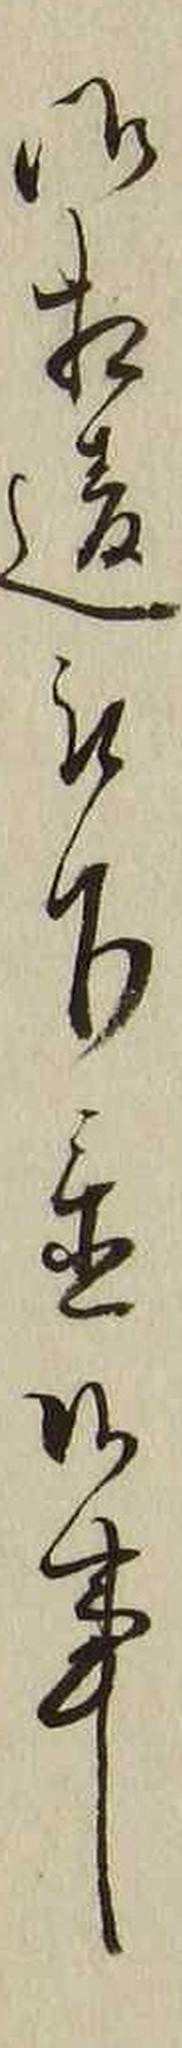御相違被下置候事
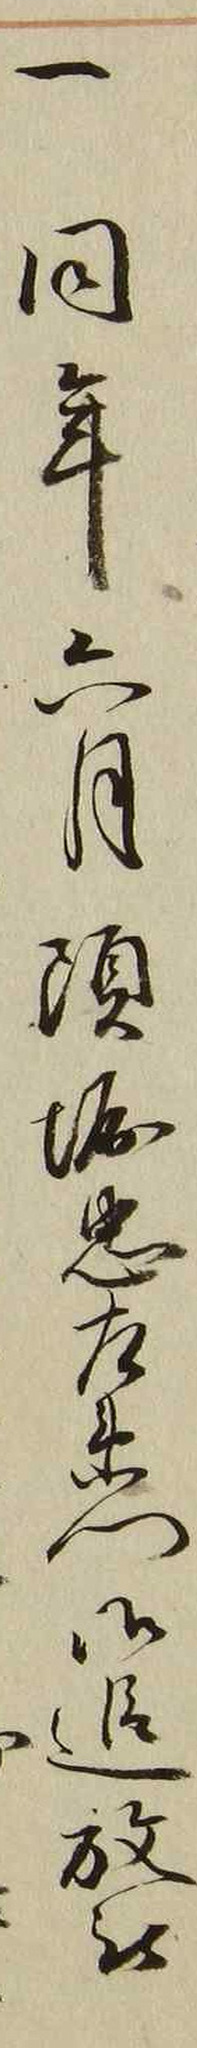一同年六月頭堀忠左衛門御追放被
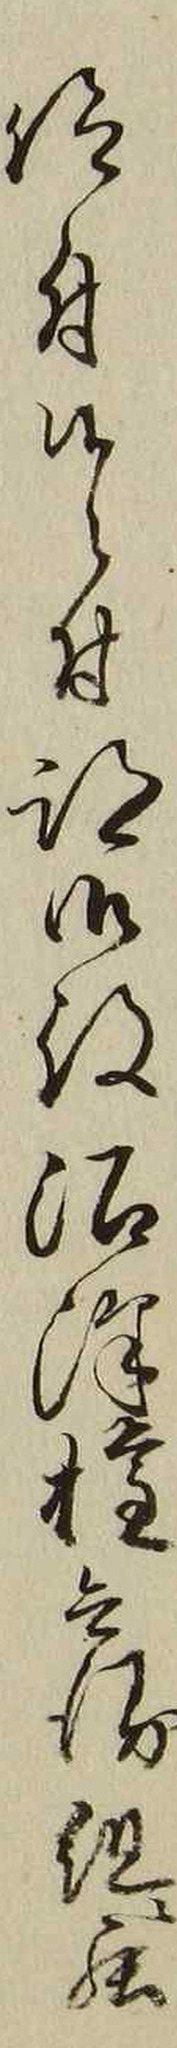仰付候に付跡御役沼津権兵衛組に罷
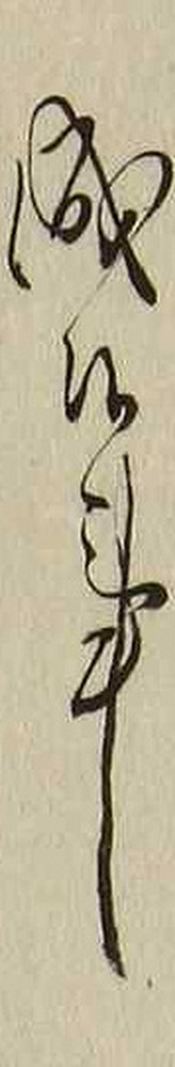成候事
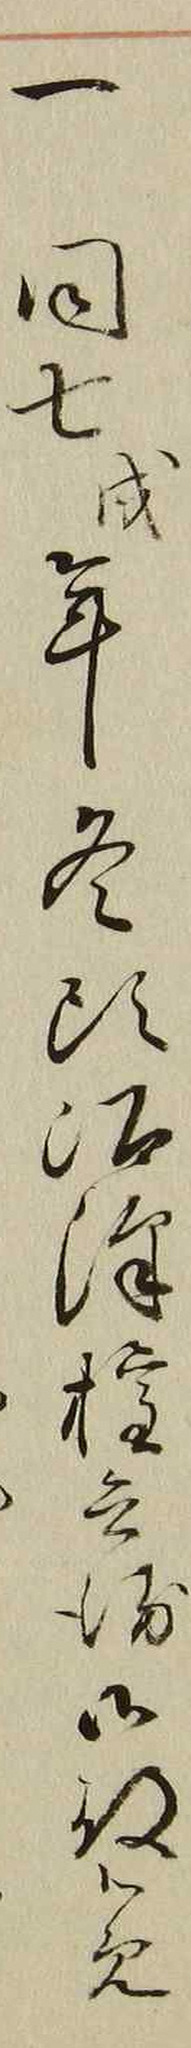一同七戌年冬頭沼津権兵衛御役御免
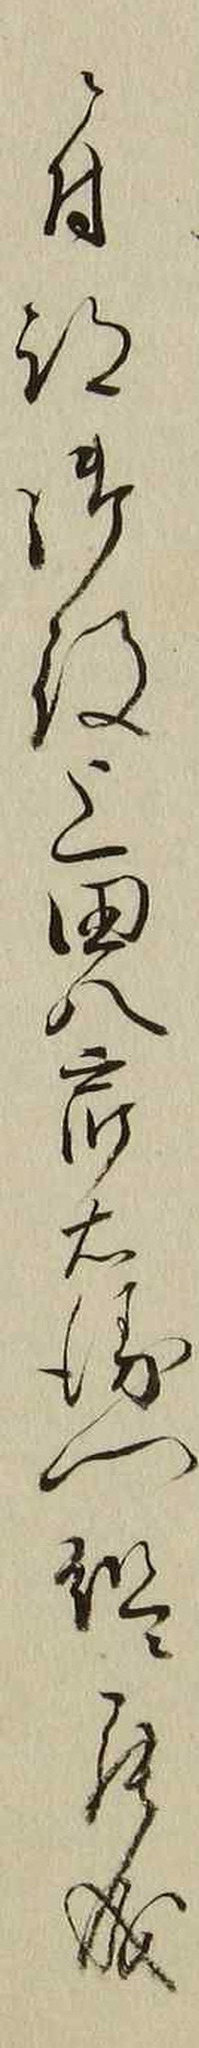に付跡御役上田八郎右衛門組に罷成
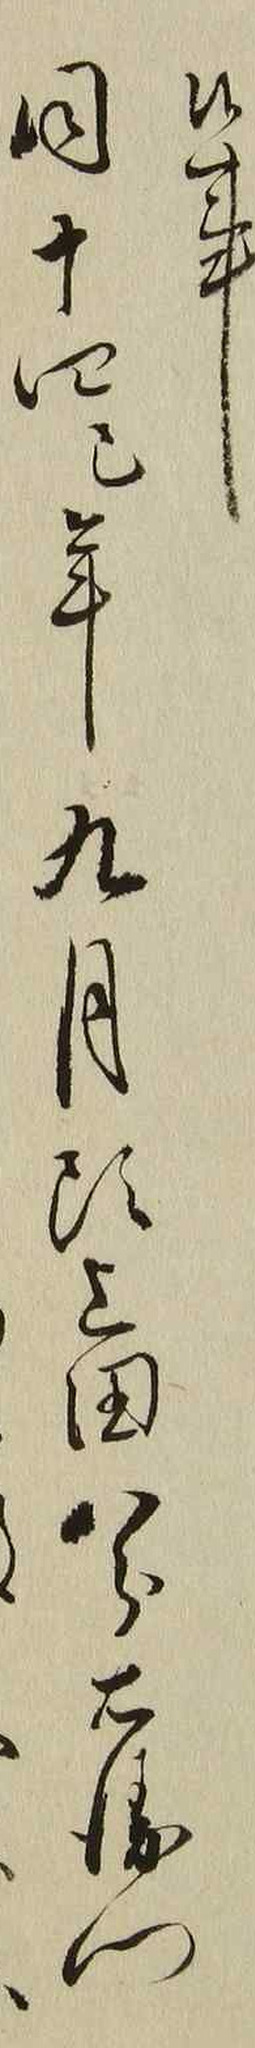同十四巳年九月頭上田八郎右衛門
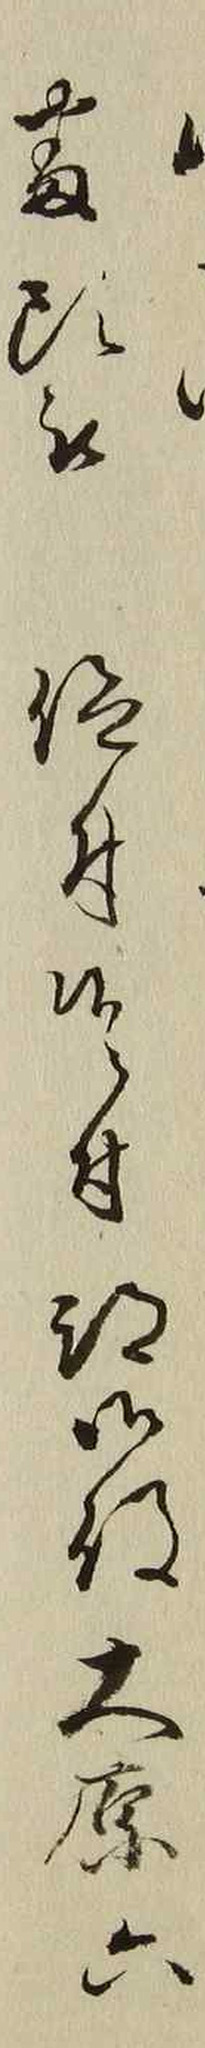番頭被仰付候に付跡御役大原六
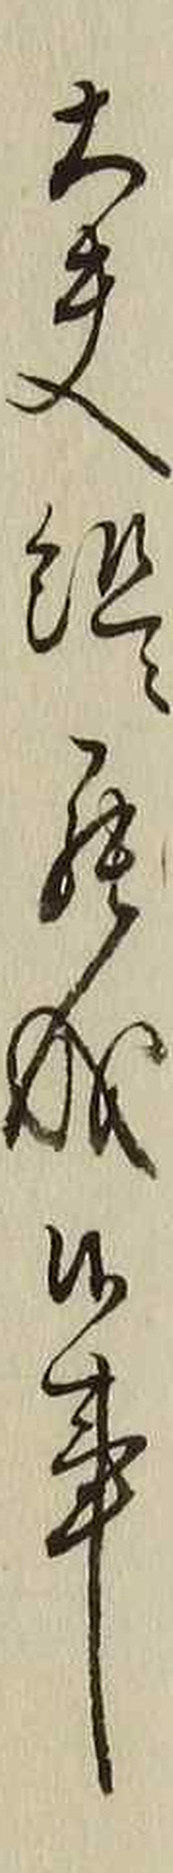太夫組に罷成候事
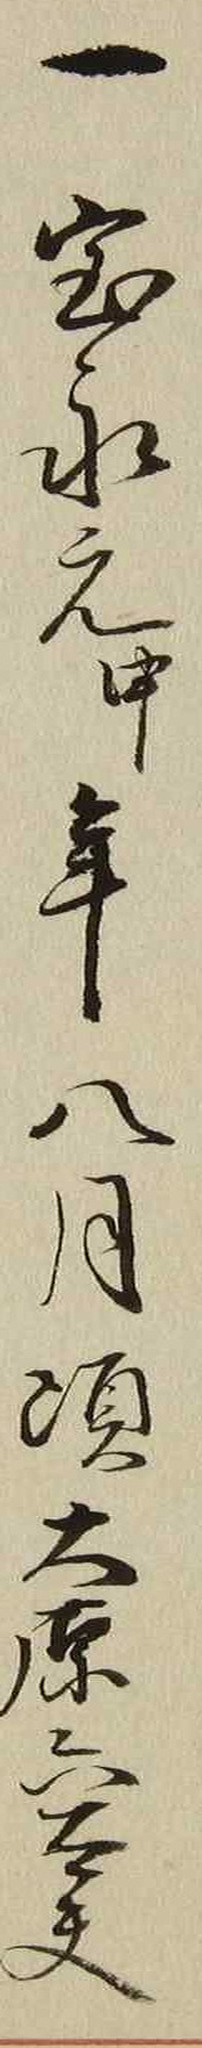一宝永元申年八月頭大原六太夫
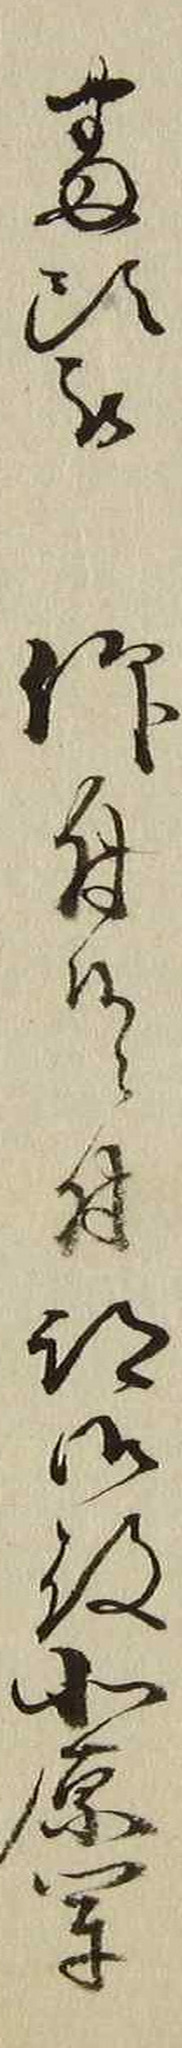番頭被仰付候に付跡御役大原六
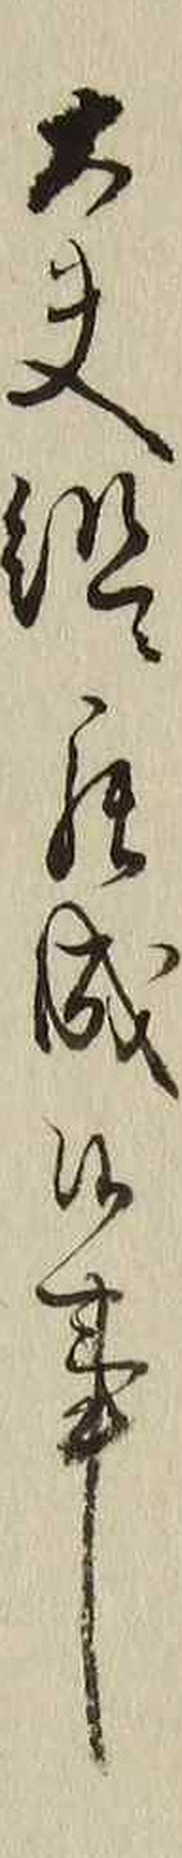太夫組に罷成候事
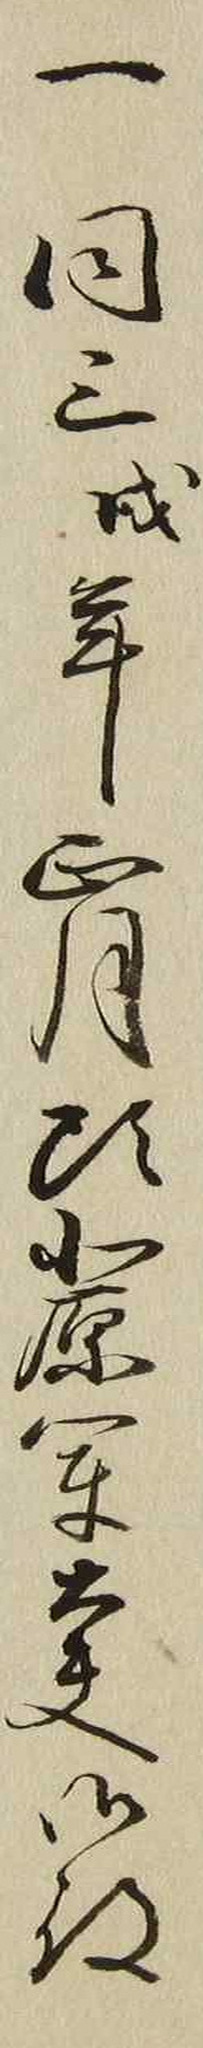一同三戌年正月頭小原軍太夫御役
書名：諸士系譜　巻之1　い之部1
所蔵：会津若松市立会津図書館
